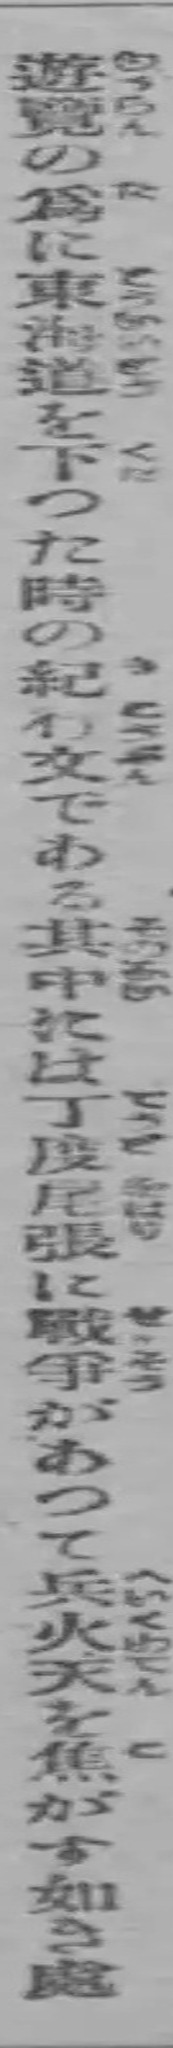遊覧の為に東海道を下つた時の紀行文である其中には丁度尾張に戦争があつて兵火天を焦がす如き処
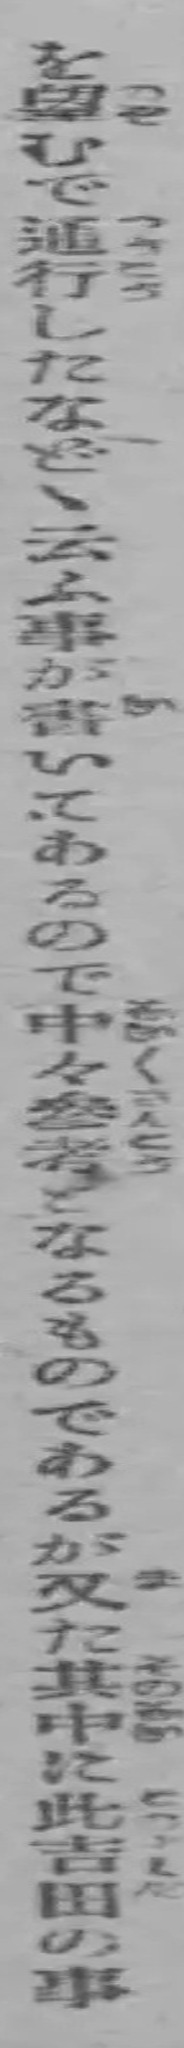を望むで通行したなどゝ云ふ事が書いてあるので中々参考となるものであるが又た其中に此吉田の事
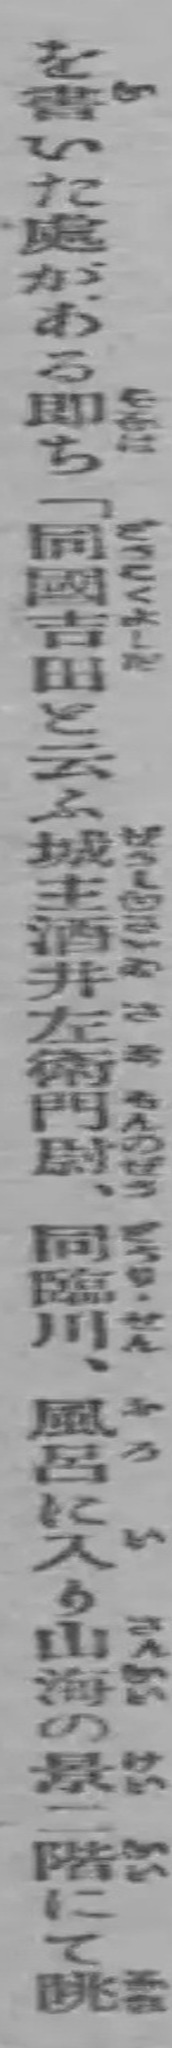を書いた処がある即ち「同国吉田と云ふ城主酒井左衛門尉、同臨川、風呂に入り山海の景二階にて眺

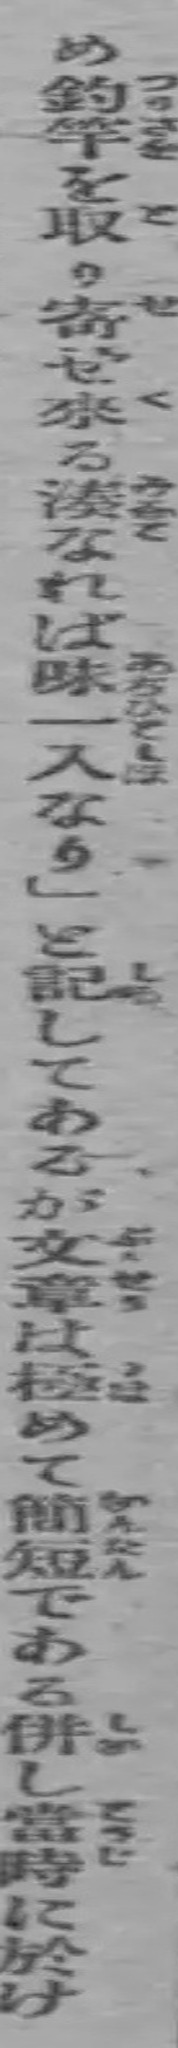め釣竿を取り寄せ来る湊なれば味一入なり」と記してあるが文章は極めて簡短である併し当時に於け
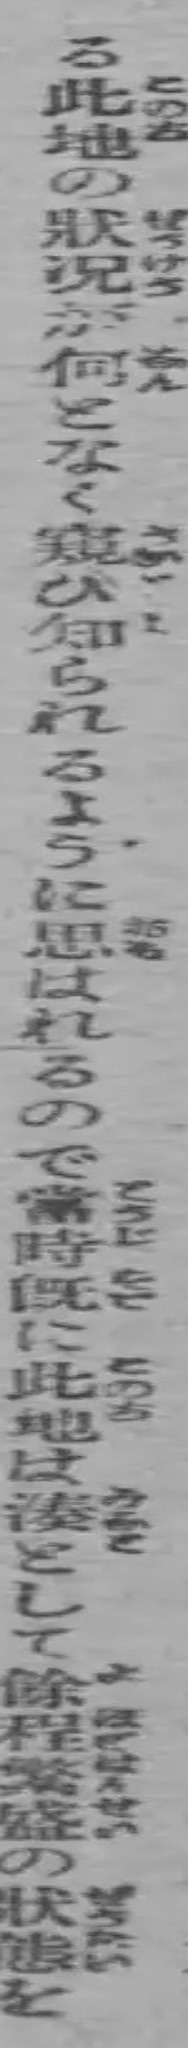る此地の状況が何となく窺ひ知られるように思はれるので当時既に此地は湊として余程繁盛の状態を
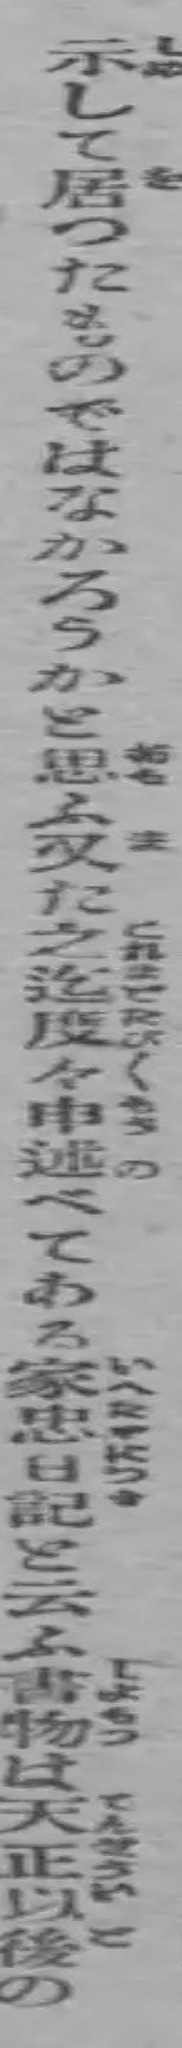示して居つたものではなかろうかと思ふ又た之迄度々申述べてある家忠日記と云ふ書物は天正以後の
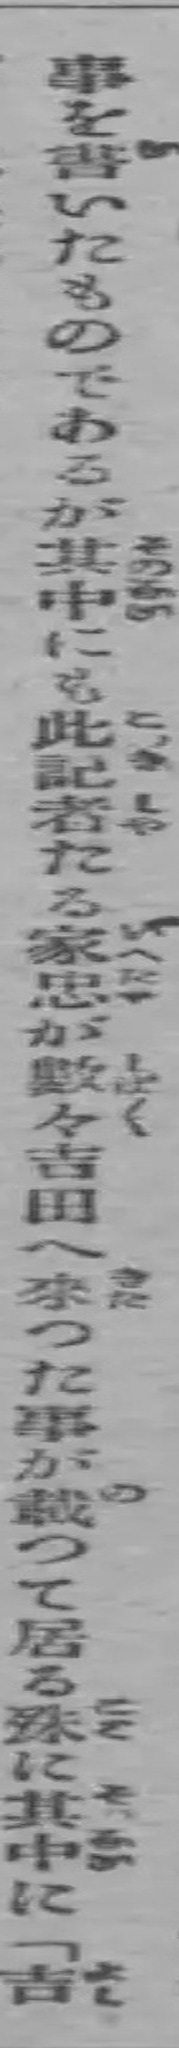事を書いたものであるが其中にも此記者たる家忠が数々吉田へ来つた事が載つて居る殊に其中に「吉
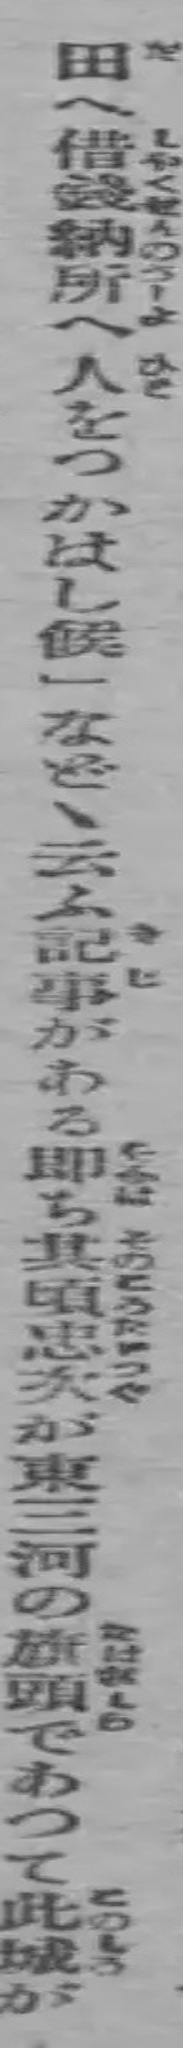田へ借銭納所へ人をつかはし候」などゝ云ふ記事がある即ち其頃忠次が東三河の旗頭であつて此城が
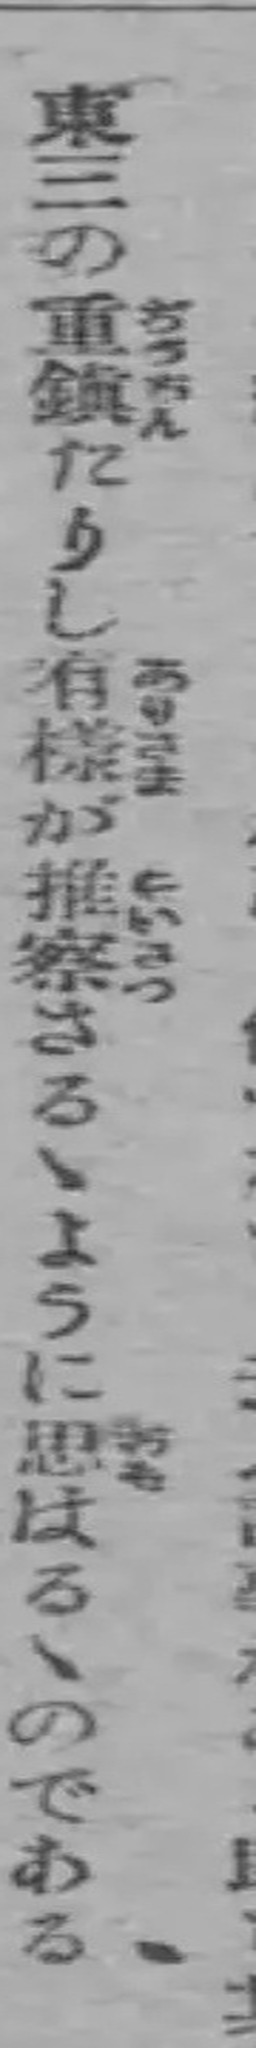東三の重鎮たりし有様が推察さるゝように思はるゝのである
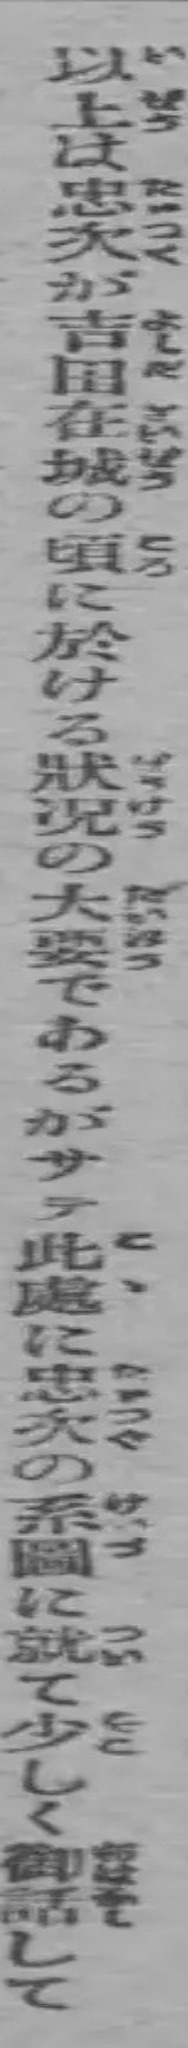酒井氏系図以上は忠次が吉田在城の頃に於ける状況の大要であるがサテ此処に忠次の系図に就て少しく御話して
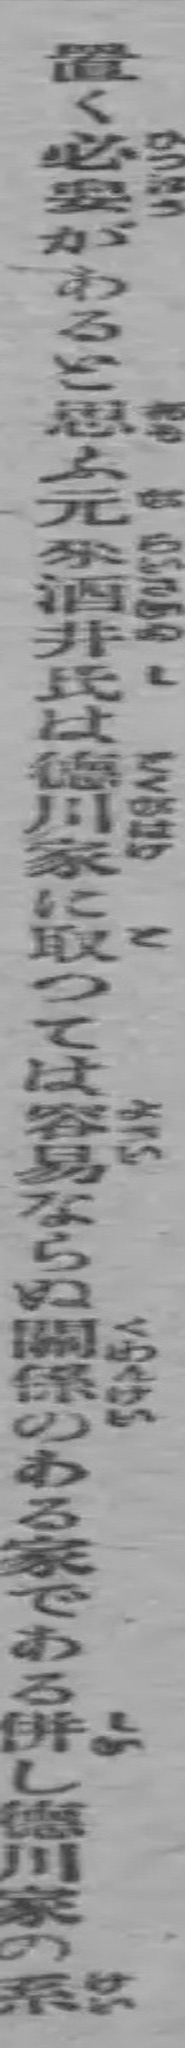置く必要があると思ふ元来酒井氏は徳川家に取つては容易ならぬ関係のある家である併し徳川家の系
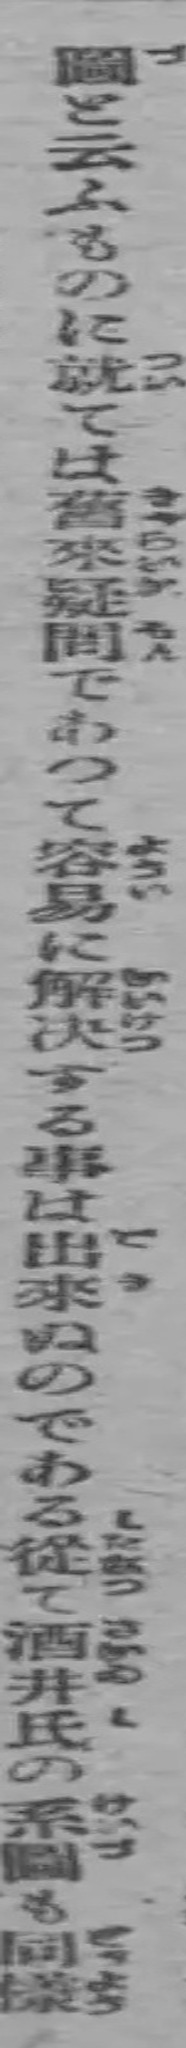図と云ふものに就ては旧来疑問であつて容易に解決する事は出来ぬのである従て酒井氏の系図も同様
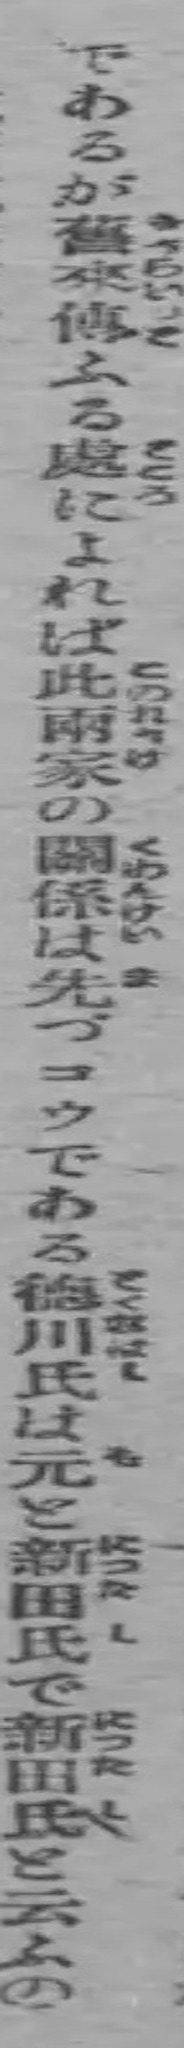であるが旧来伝ふる処によれば此両家の関係は先づコウである徳川氏は元と新田氏で新田氏と云ふの
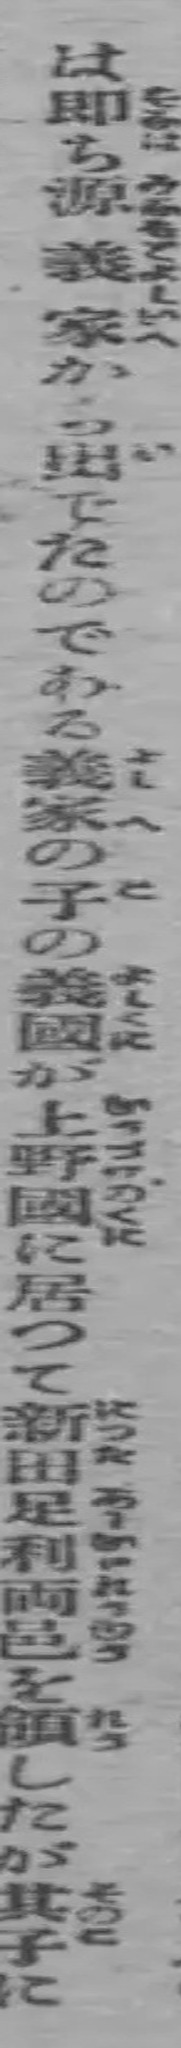は即ち源義家から出でたのである義家の子の義国が上野国に居つて新田足利両邑を領したが其子に
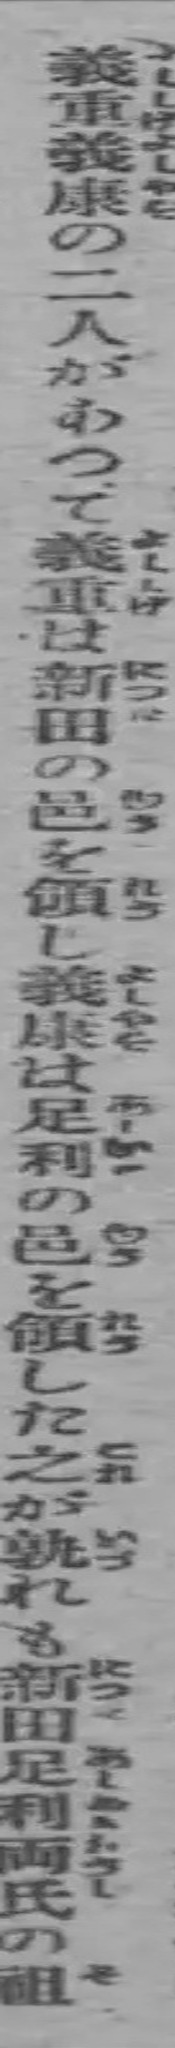義重義康の二人があつて義重は新田の邑を領し義康は足利の邑を領した之が孰れも新田足利両氏の祖
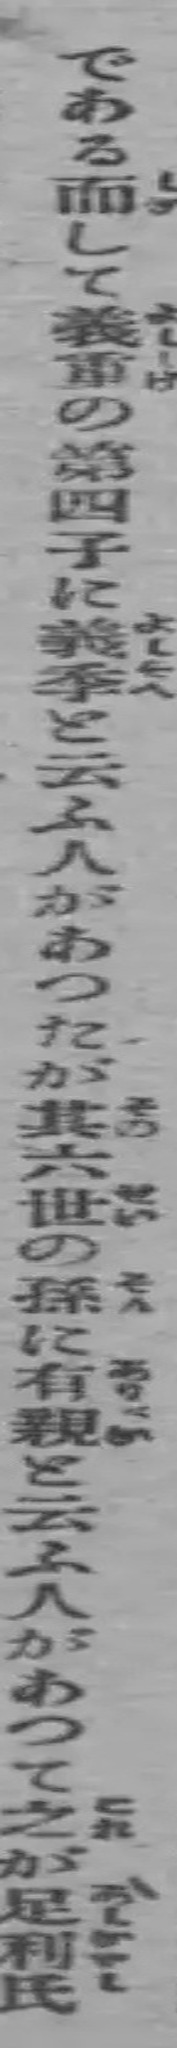である而して義重の第四子に義季と云ふ人があつたが其六世の孫に有親と云ふ人があつて之が足利
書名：豊橋市史談
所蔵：国立国会図書館 National Diet Library, JAPAN
